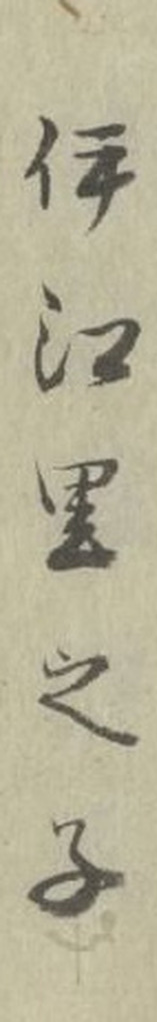笛伊江里之子

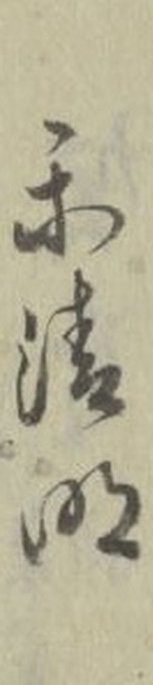楽清明
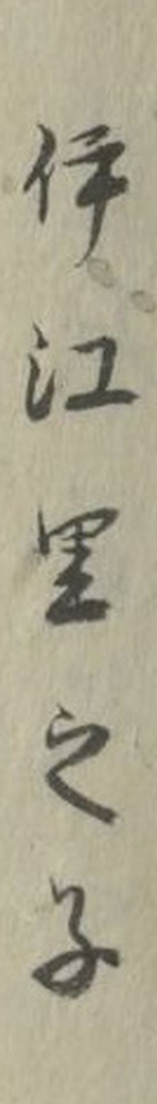笛伊江里之子
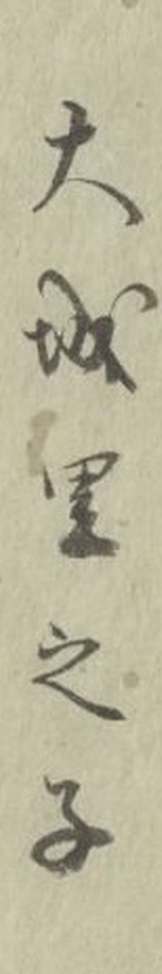韻鑼大城里之子

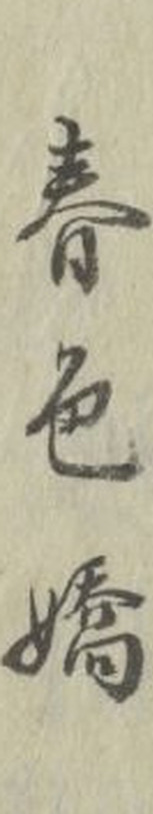春色嬌
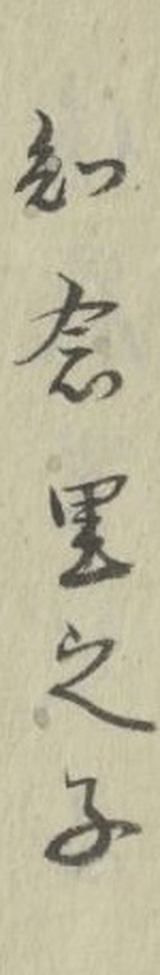三絃知念里之子
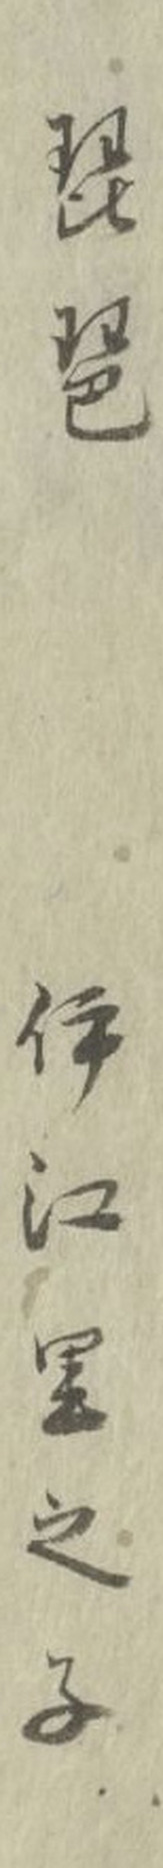琵琶伊江里之子
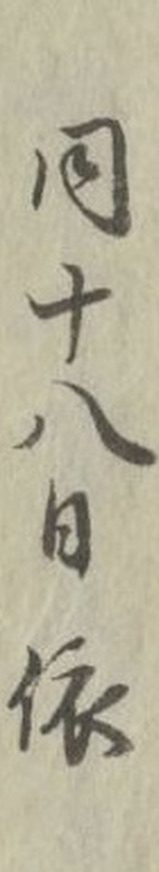同十八日依

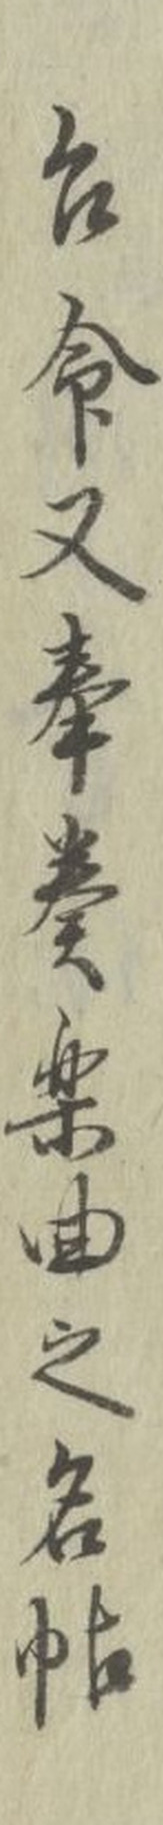台命又奉奏楽曲之名帳
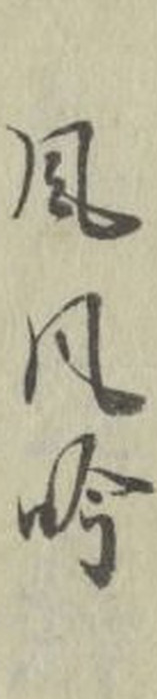鳳風吟
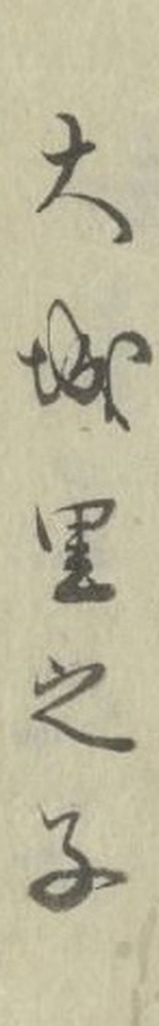韻鑼大城里之子
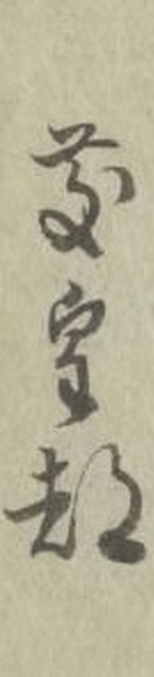慶皇都

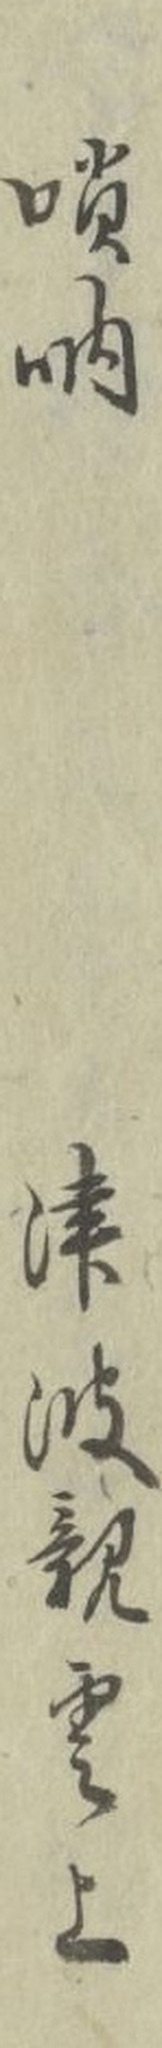嗩吶津波親雲上
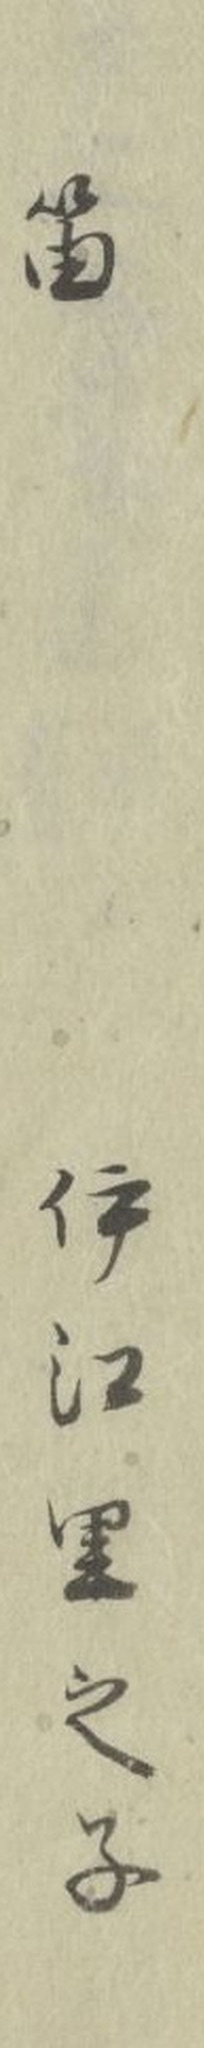笛伊江里之子
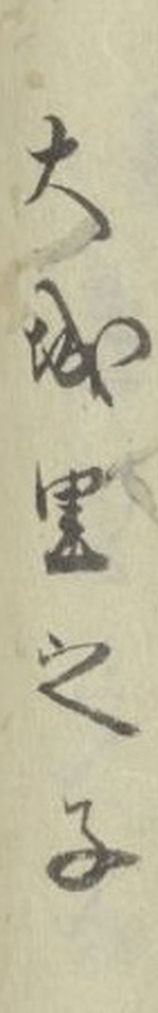韻鑼大城里之子
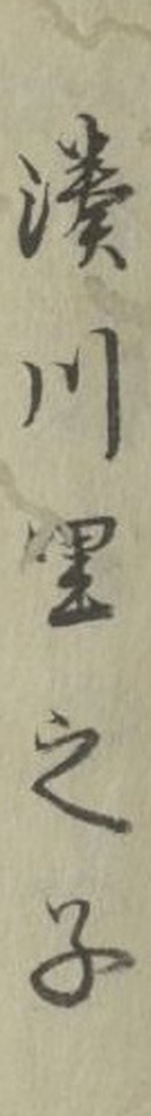韻鑼大城里之子
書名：琉球来朝記 自八至十四終
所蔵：University of the Ryukyus Library
